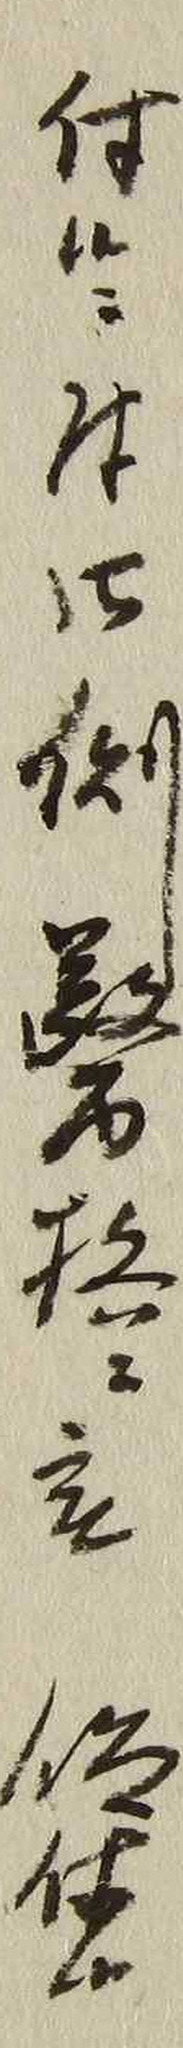付候ニ付御側医格ニ被仰付候
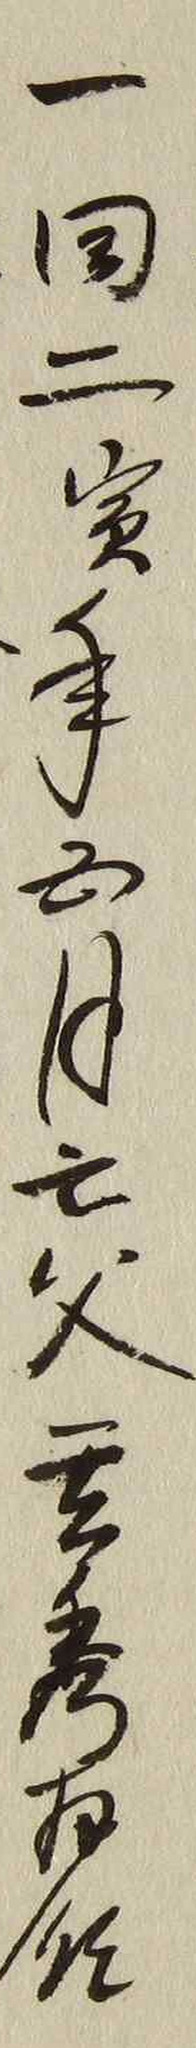一同二寅年五月亡父玄秀拝領
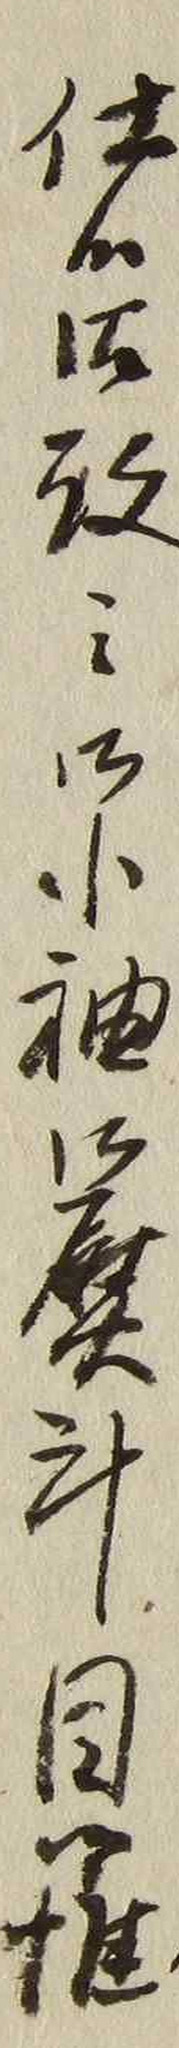仕候御紋之御小袖御熨斗目御帷
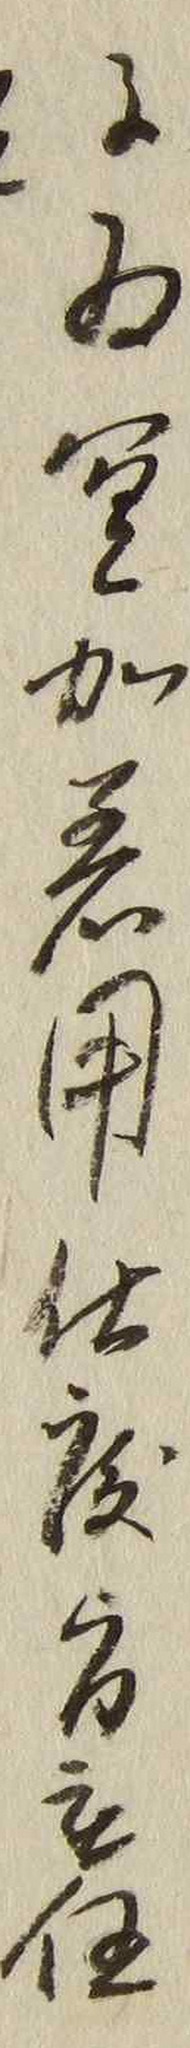子為冥加着用仕度旨被任
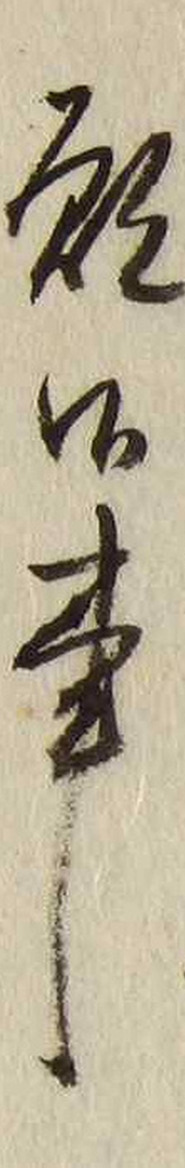願候事

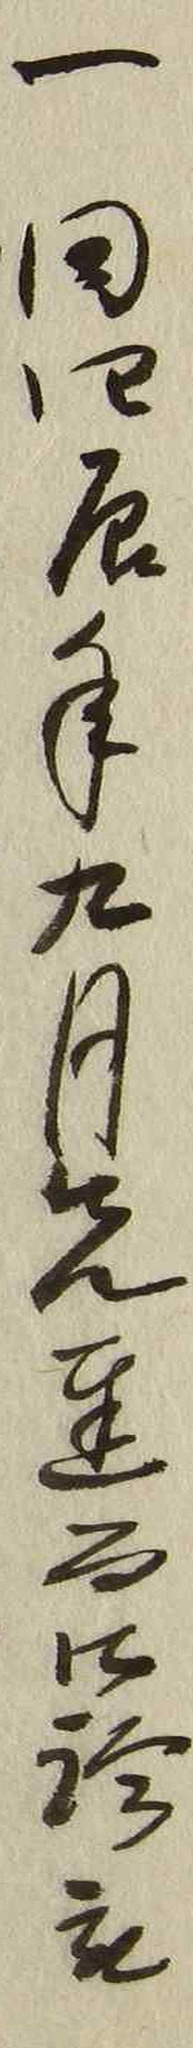一同四辰年九月先達而御診被
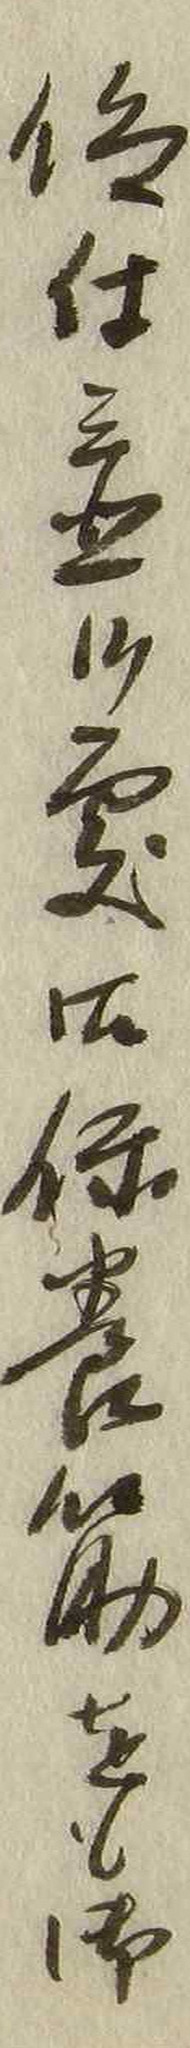仰付置候処御保養筋をも御
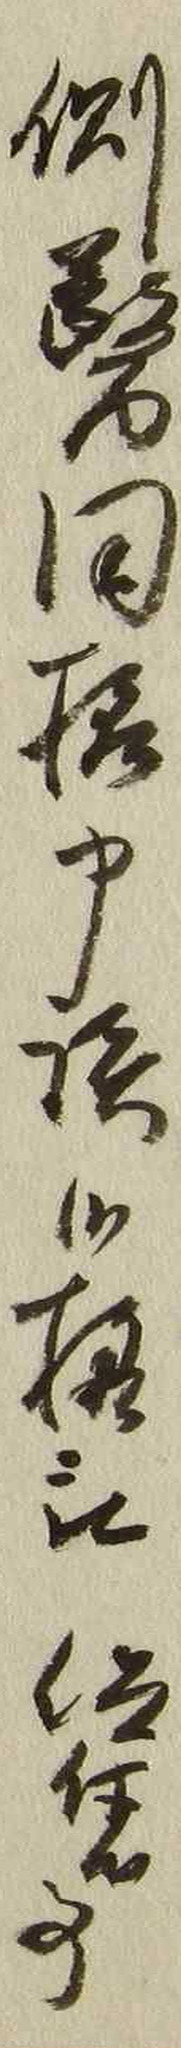側医同様申談候様被仰付候事
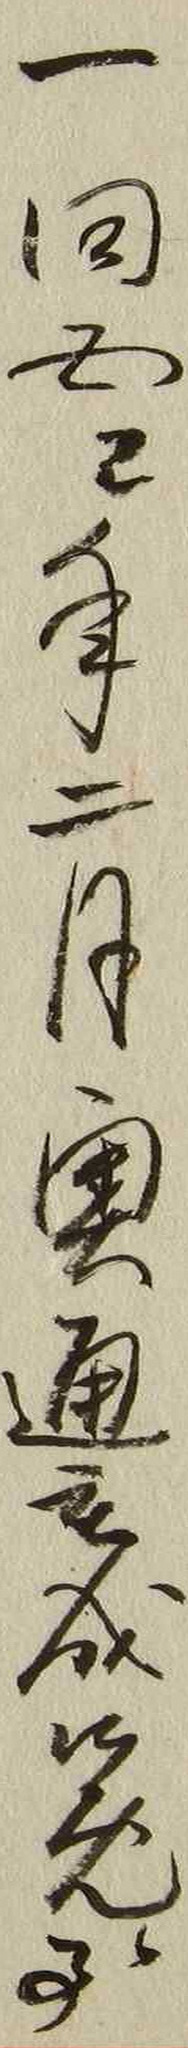一同五巳年二月奥通被成御免候事
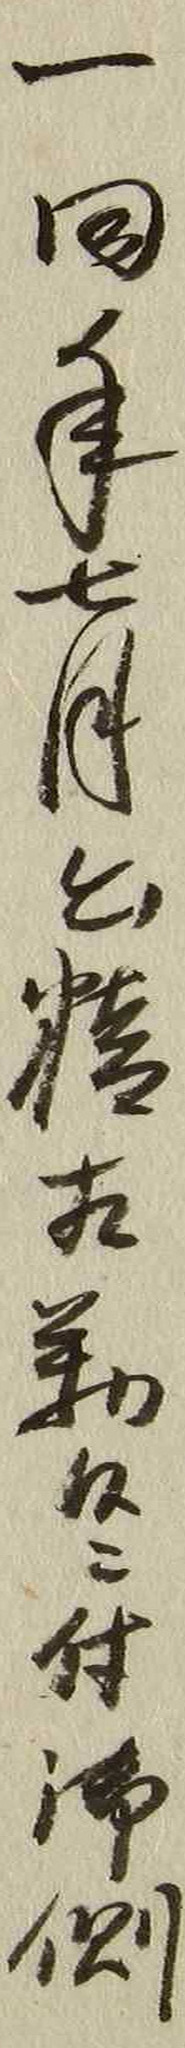一同年七月出精相勤候ニ付御側
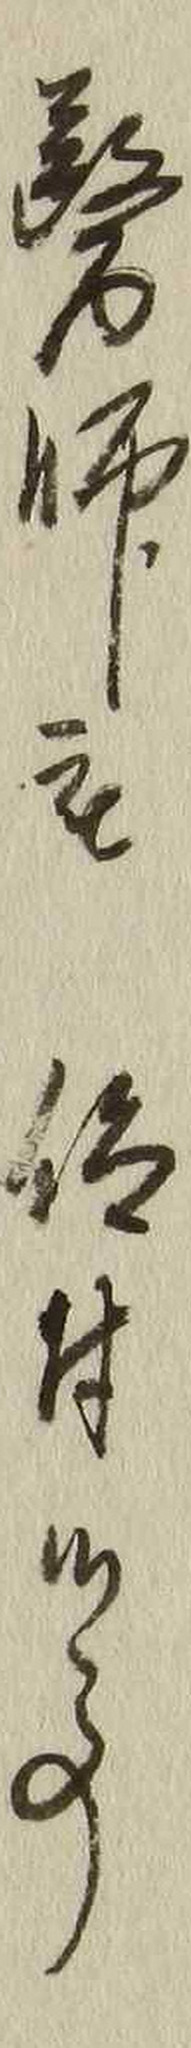医師被仰付候事
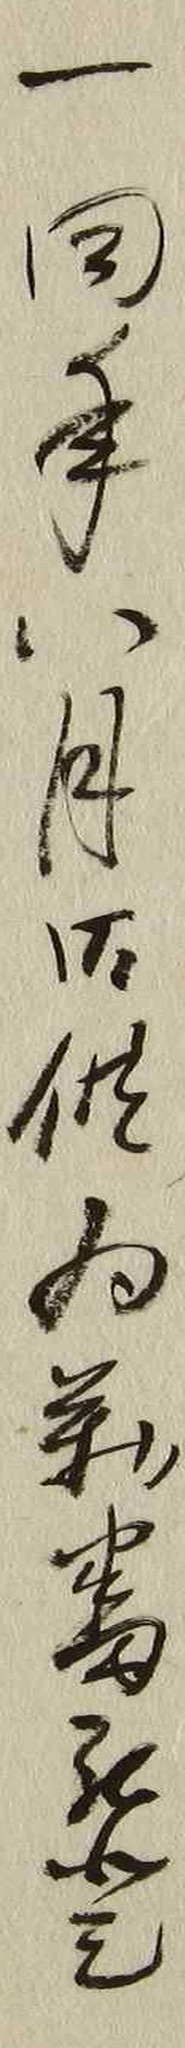一同年八月御供為勤番罷登
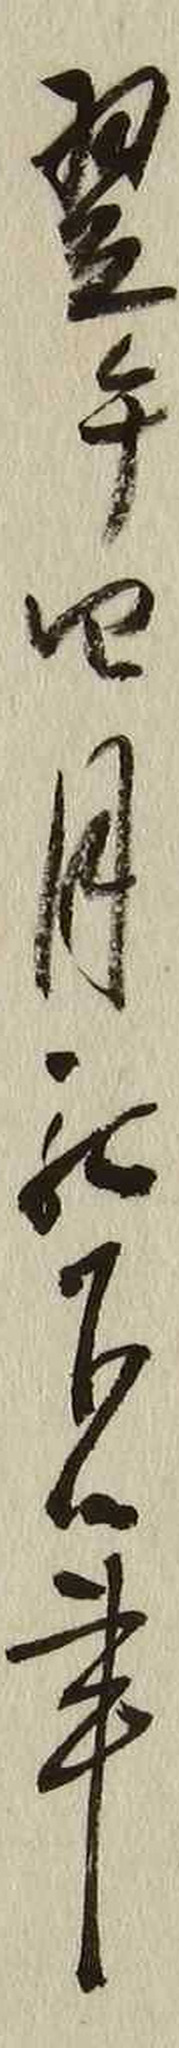翌午四月罷下候事
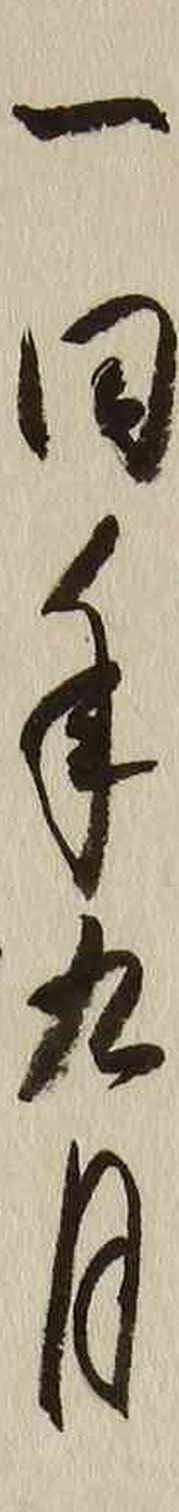一同年九月
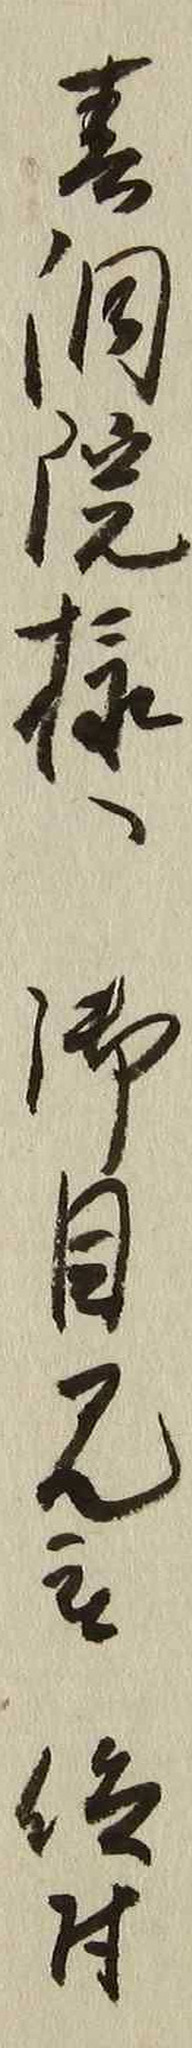春洞院様へ御目見被仰付
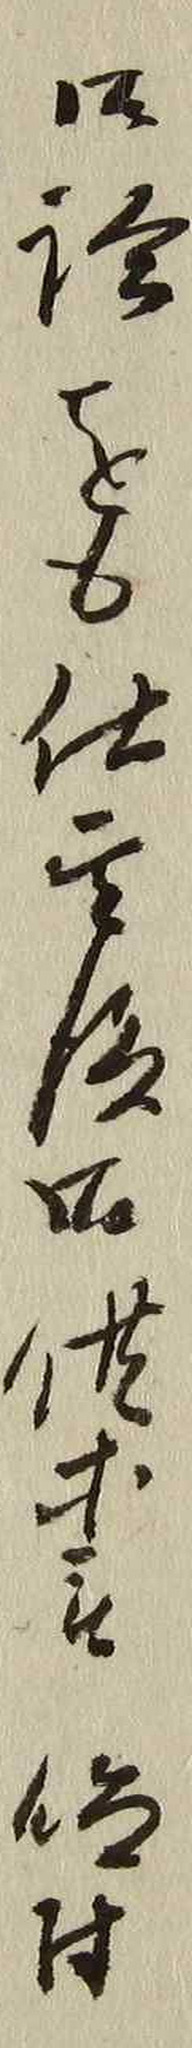御診をも仕其後御供等被仰付
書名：諸士系譜　巻之353　す之部3
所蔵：会津若松市立会津図書館
